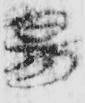昜（陽）
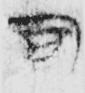司
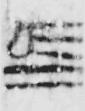馬
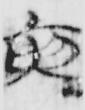寅
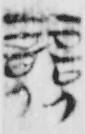競
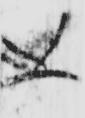之
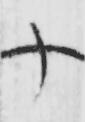七
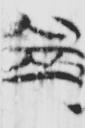益
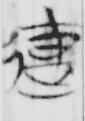連
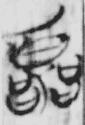囂
